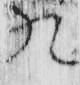九
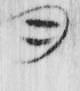月
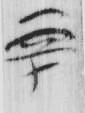辛
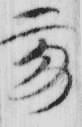亥
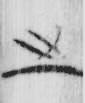之
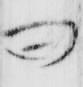日
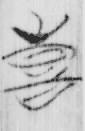喜
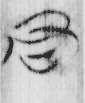君
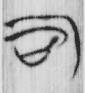司
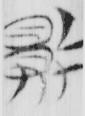敗
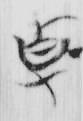史
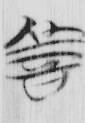善
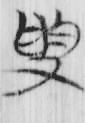受
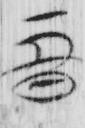○（期）
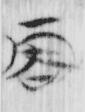丙
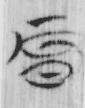晨
